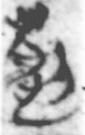○（貂）
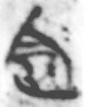定
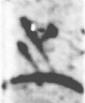之
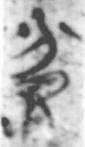貧（紛）
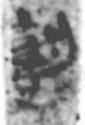韌
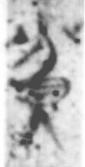貧（紛）
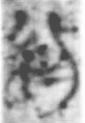紫
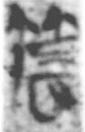○（席）
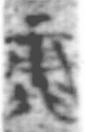彔（綠）
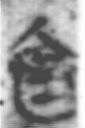裏
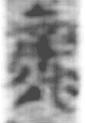彔（綠）
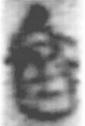裏
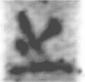之
